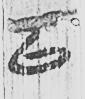㠯（以）
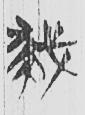{求戈}
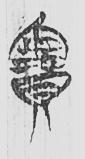賽
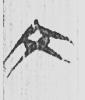文
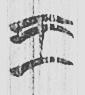王
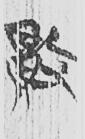敗
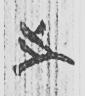之
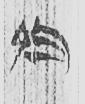於
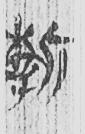新
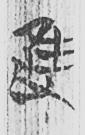雘
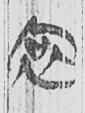哀
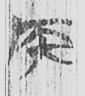侯
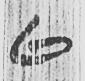㠯（以）
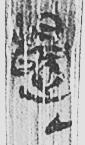歸
